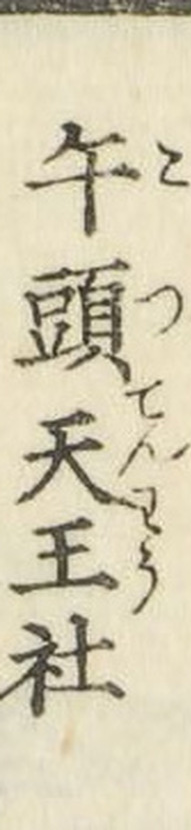午頭天王社

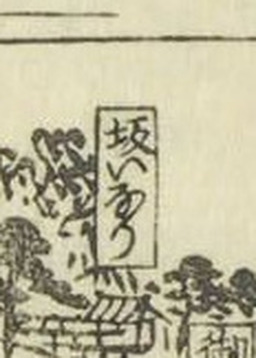坂いなり

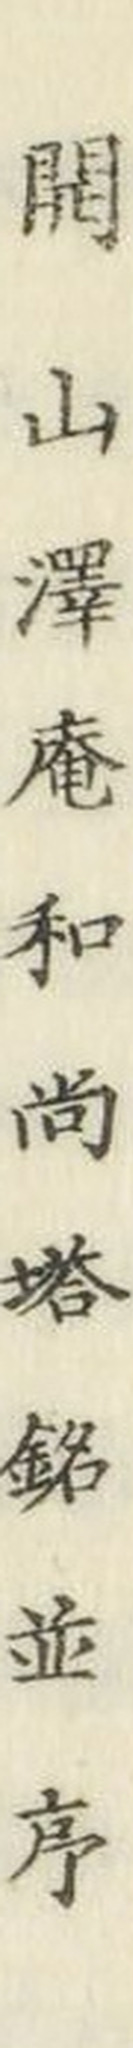開山澤庵和尚塔銘並序
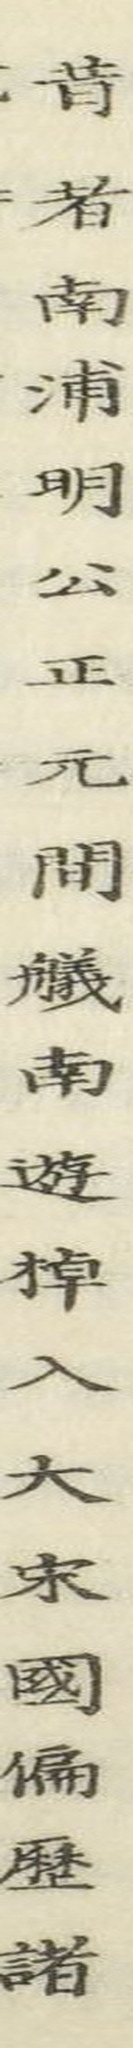昔者南浦明公正元間艤南遊棹入大宋國偏曆諸
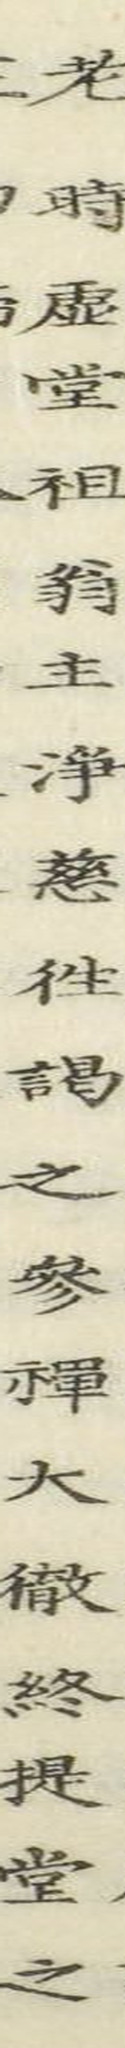老時虚堂祖翁主淨慈往謁之參禪大徹終提堂之
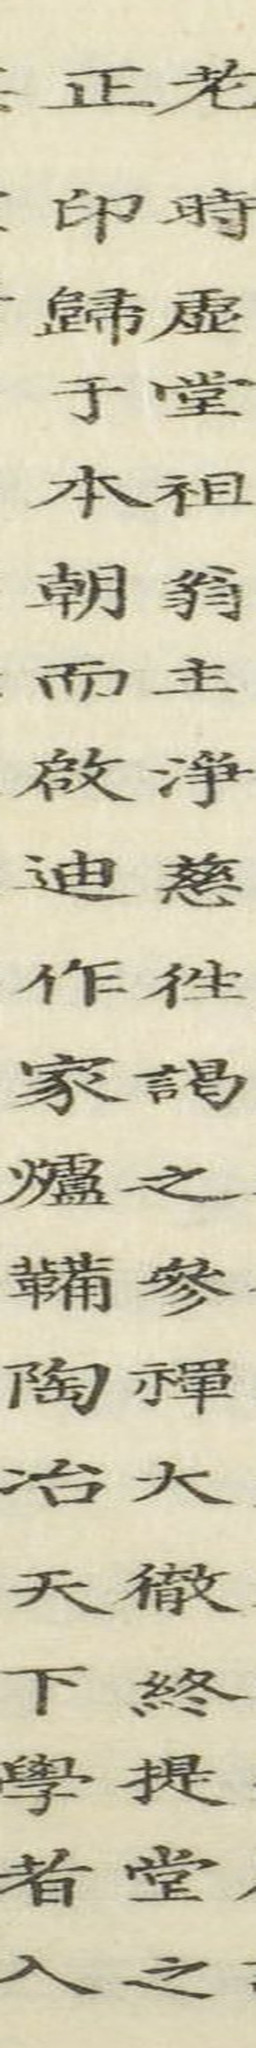正印歸于本朝而啟迪作家爐鞴陶冶天下學者入
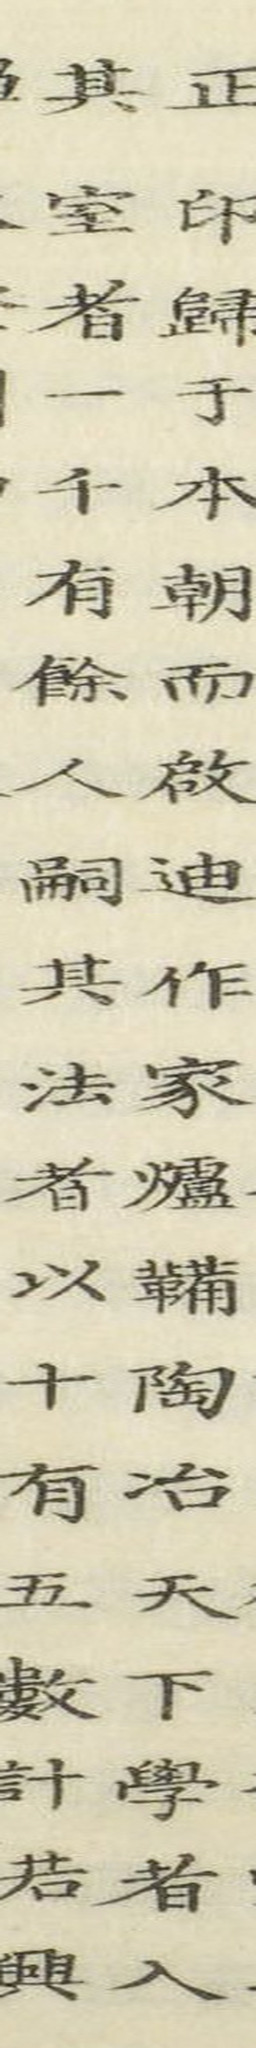其室者一千有餘人嗣其法者以十有五數計若興
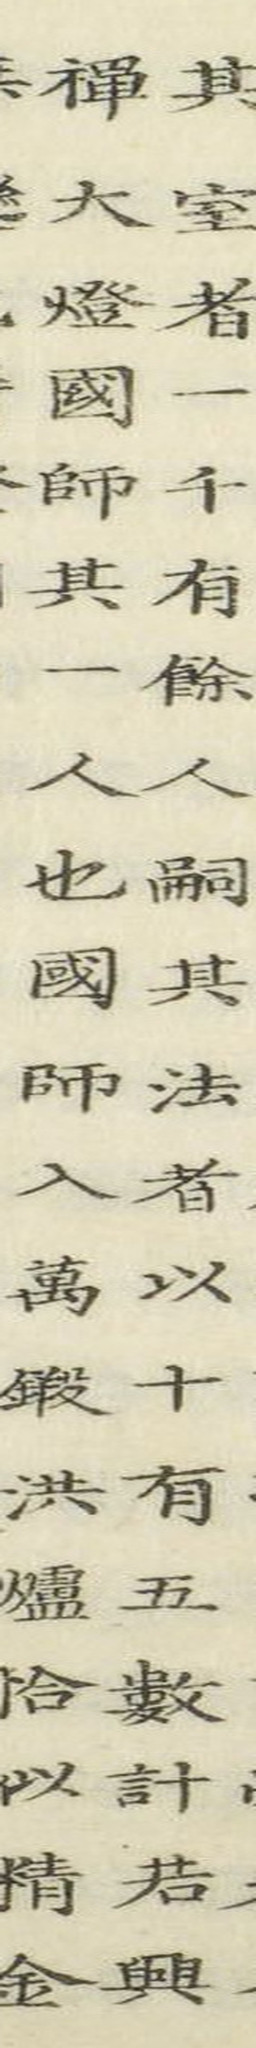禪大燈國師其一人也國師入萬鍛洪爐恰似精金
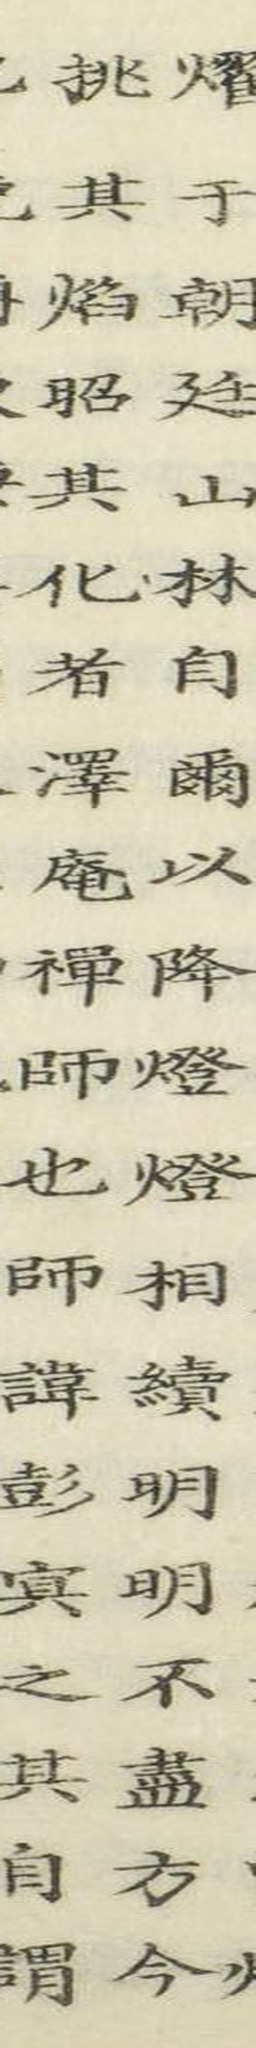挑其焰昭其化者澤庵禪師也師諱彭㝠之其自謂
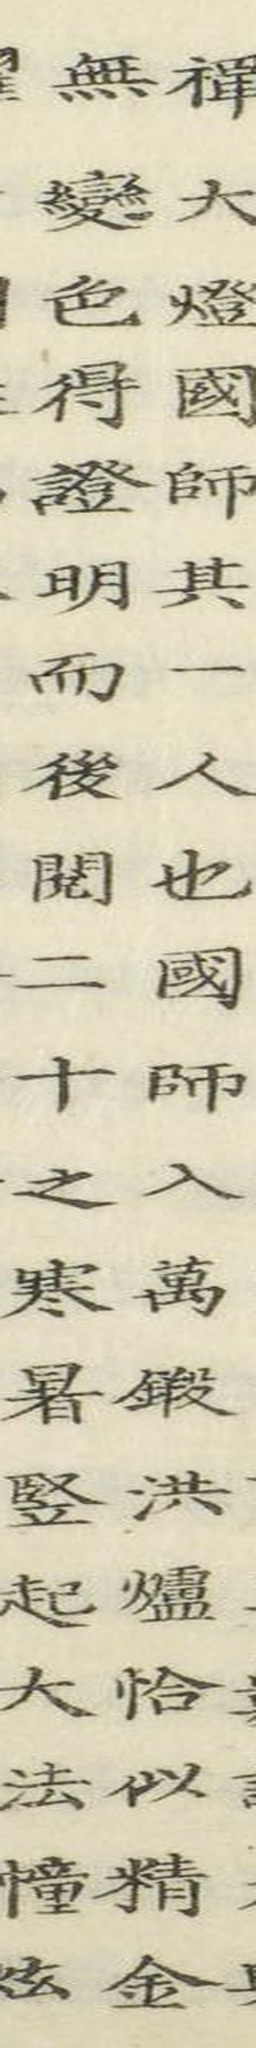無變色得證明而後閱二十之寒暑竪起大法幢炫
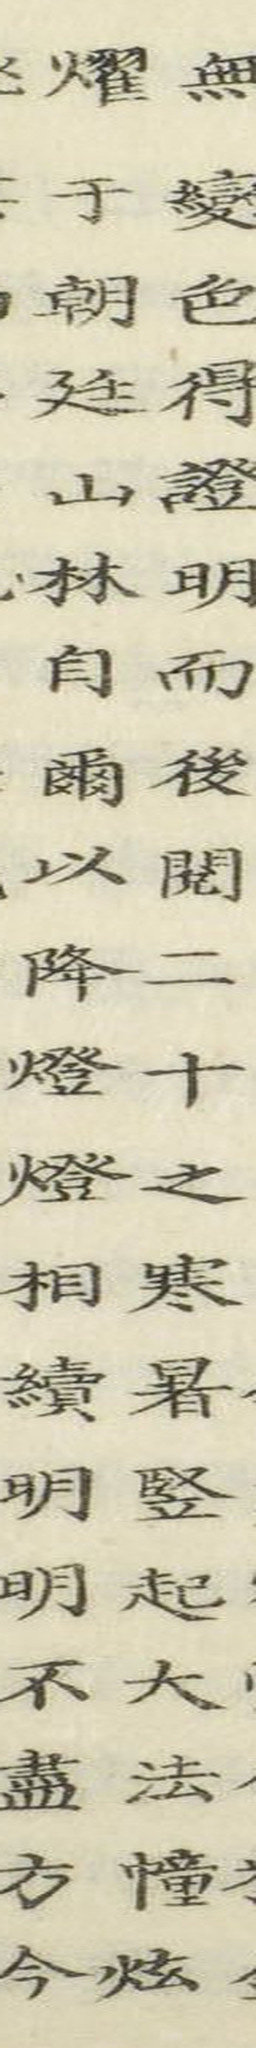燿于朝廷山林自爾以降燈燈相續明明不盡方今
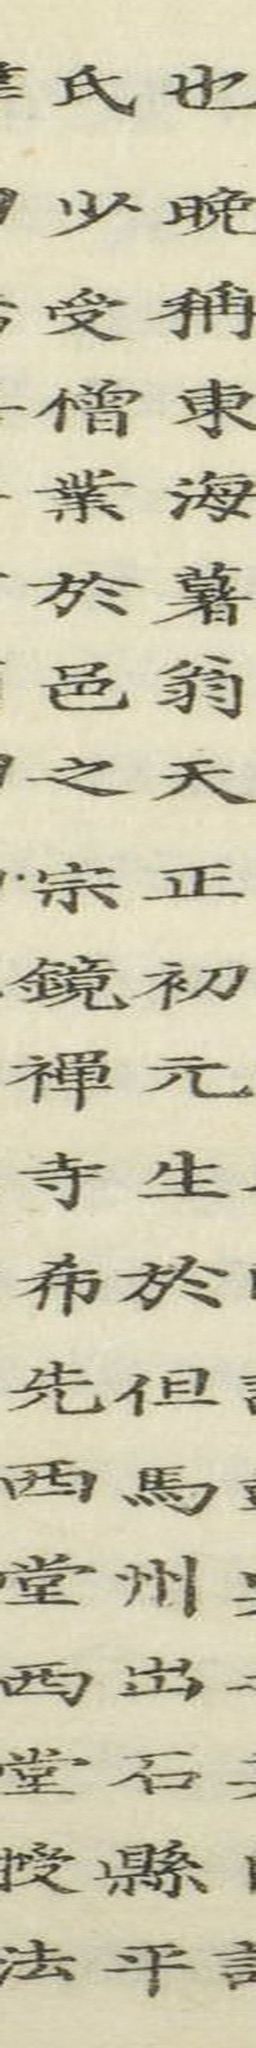氏少受僧業於邑之宗鏡禪寺希先西堂西堂授法
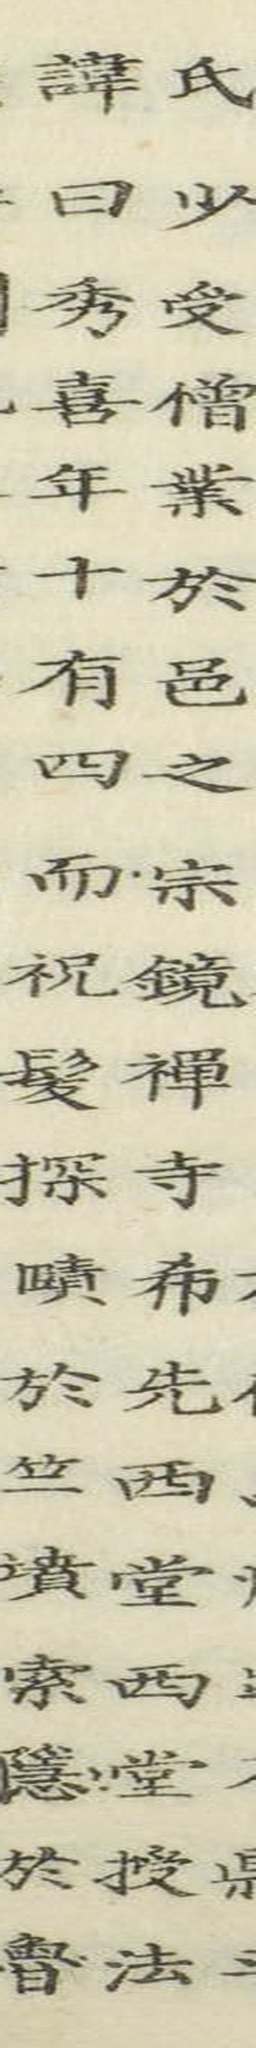諱曰秀喜年十有四而祝髪探賾於竺墳索隱於魯
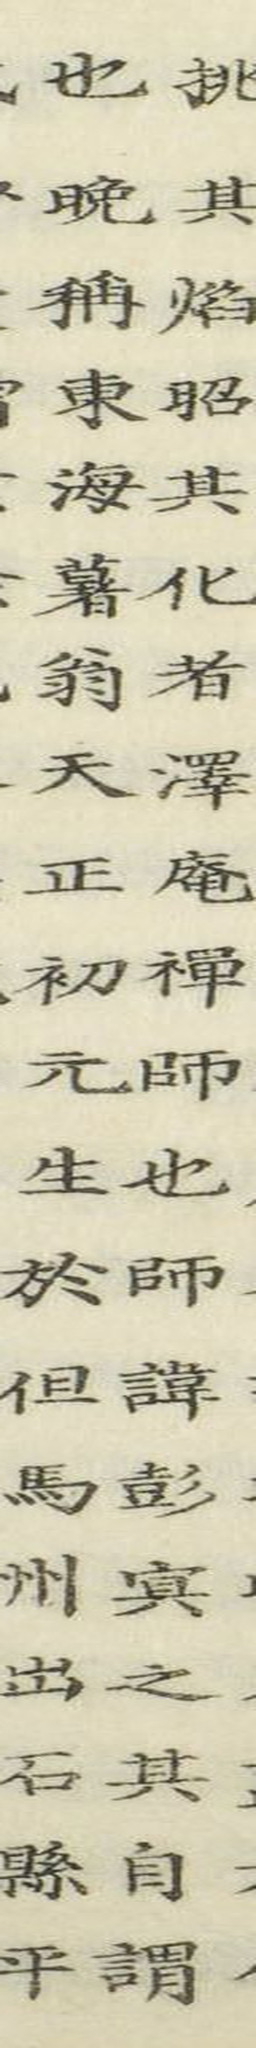也晩稱東海翁天正初元生於但馬州出石縣平
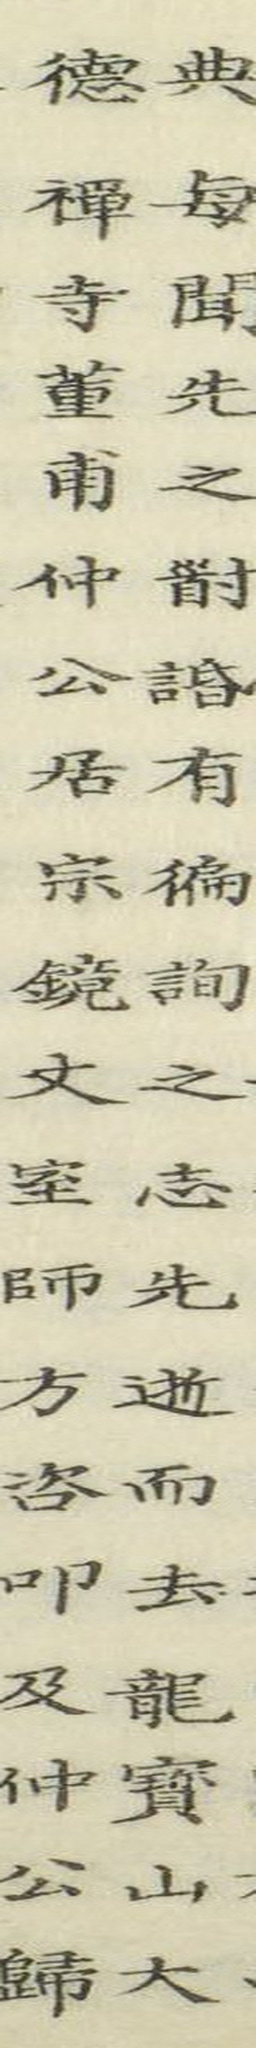德禪寺董甫仲公居宗鏡丈室師方咨叩及仲公歸
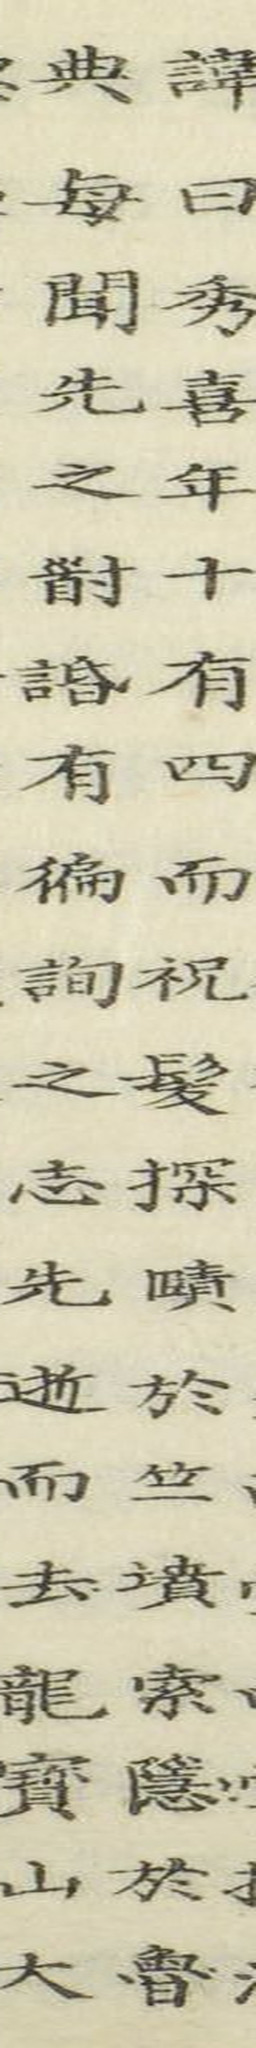典每聞先之𡬹諙有徧詢之志先逝而去龍寳山大
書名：江戸名所図会 20巻 巻之4
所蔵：東京学芸大学教育コンテンツアーカイブ
